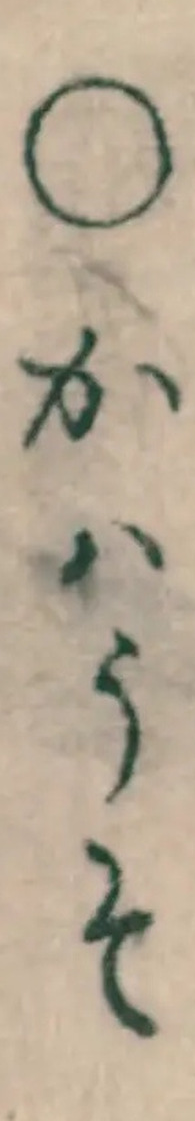○かはうそ
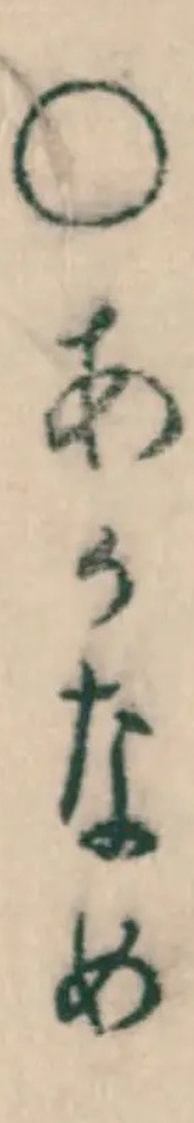○あかなめ
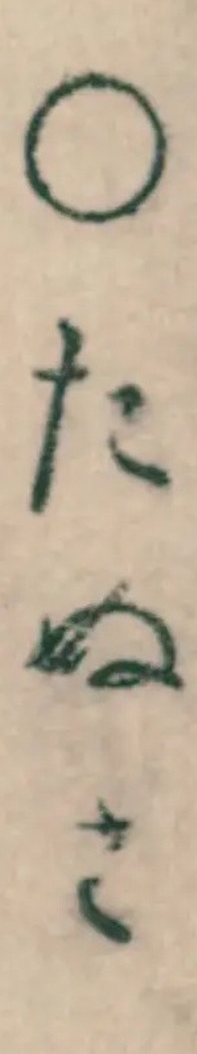○たぬき
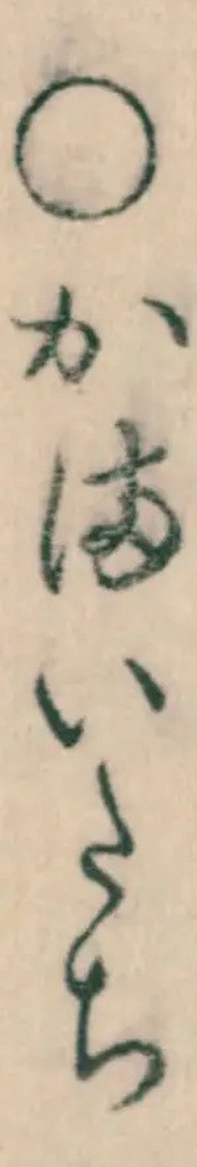○かまいたち
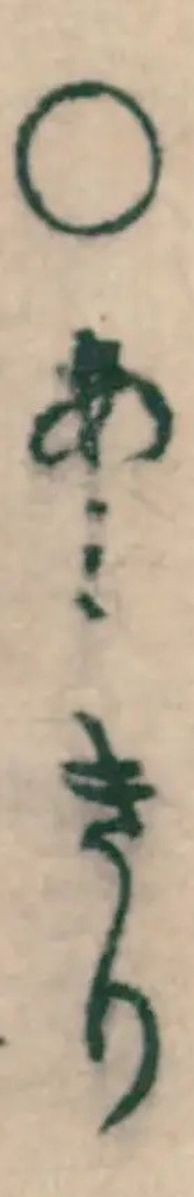○あみきり
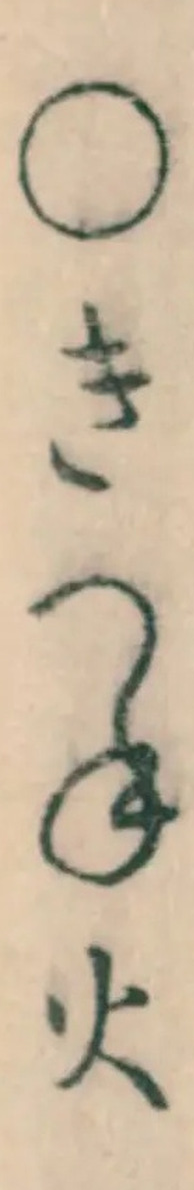○きつね火
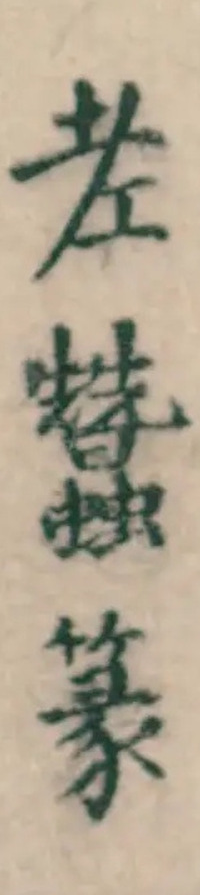老蠶篆

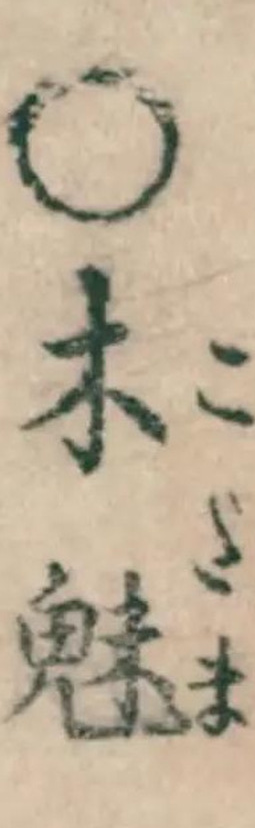○木魅
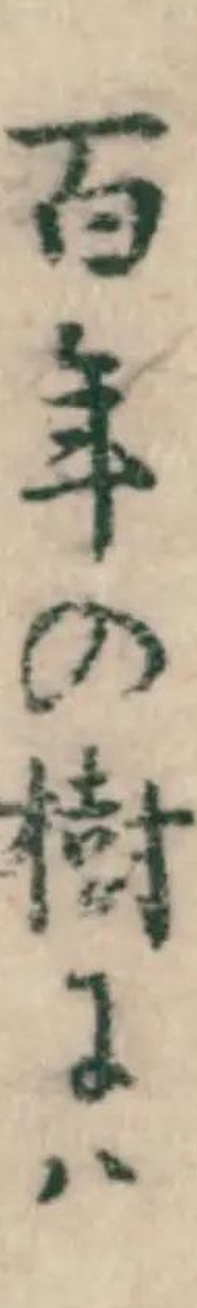百年の樹には
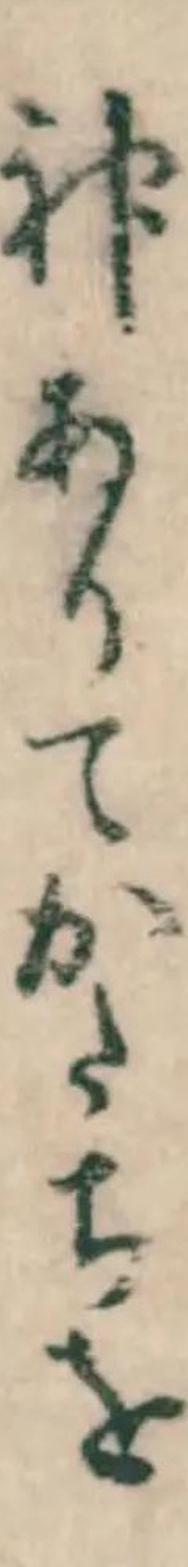神ありてかたちを
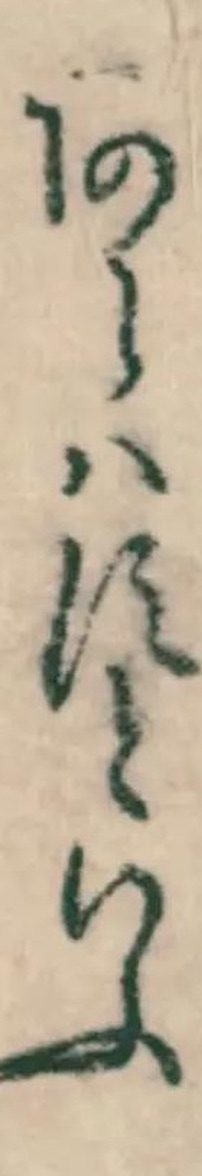あらはすといふ

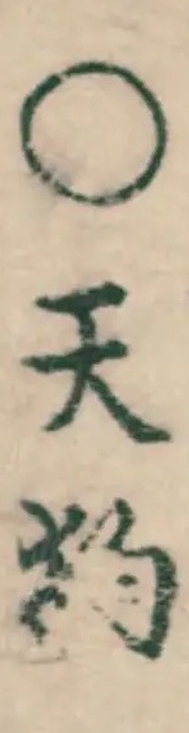○天狗

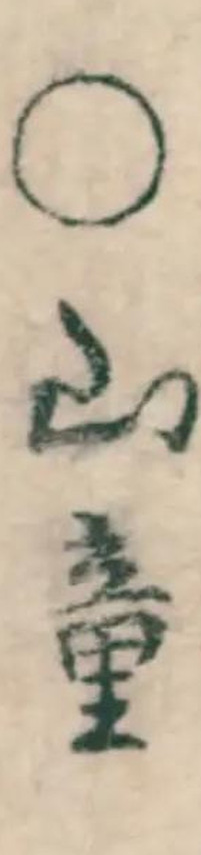○山童
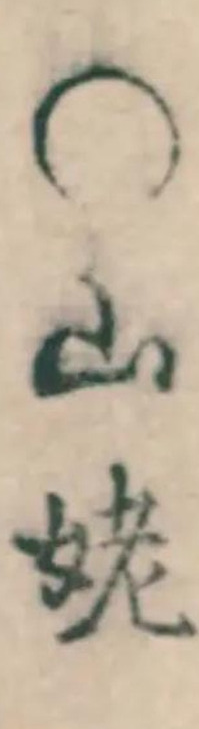○山姥

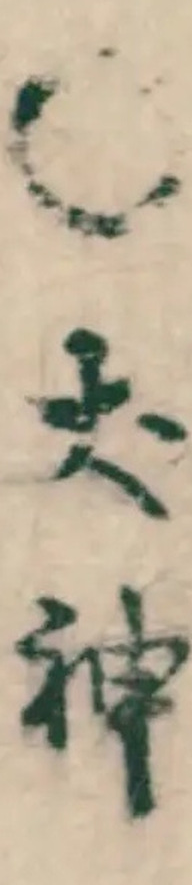○犬神
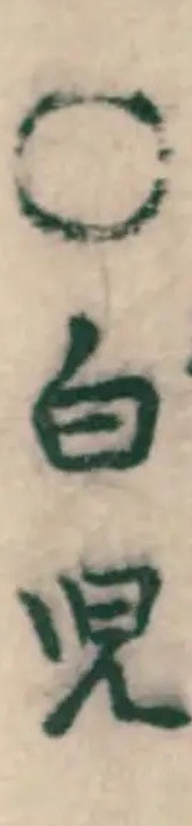○白児
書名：百鬼夜行 3巻拾遺3巻. [1]
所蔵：国立国会図書館 National Diet Library, JAPAN
